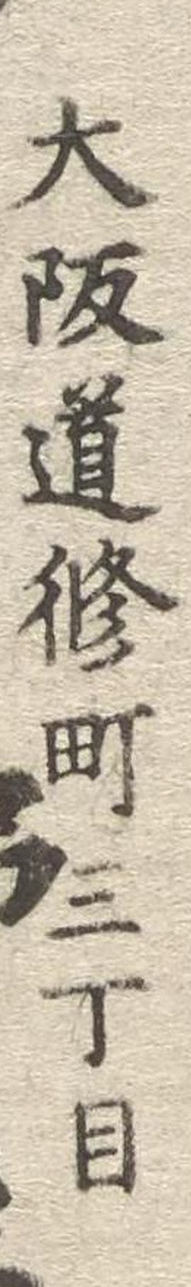大阪道修町三丁目
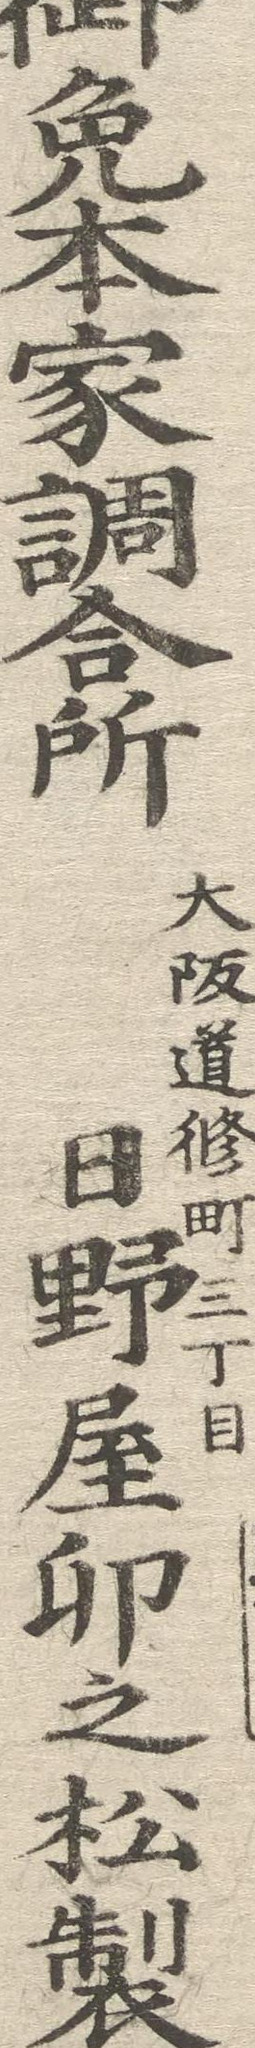御免本家調合所日野屋卯之松製
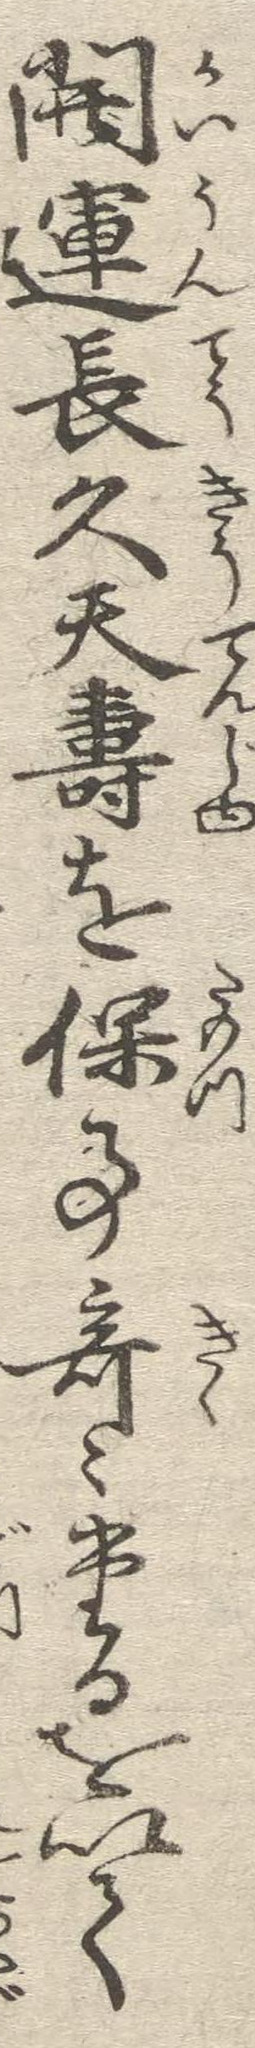開運長久天寿を保事奇々たるを以て
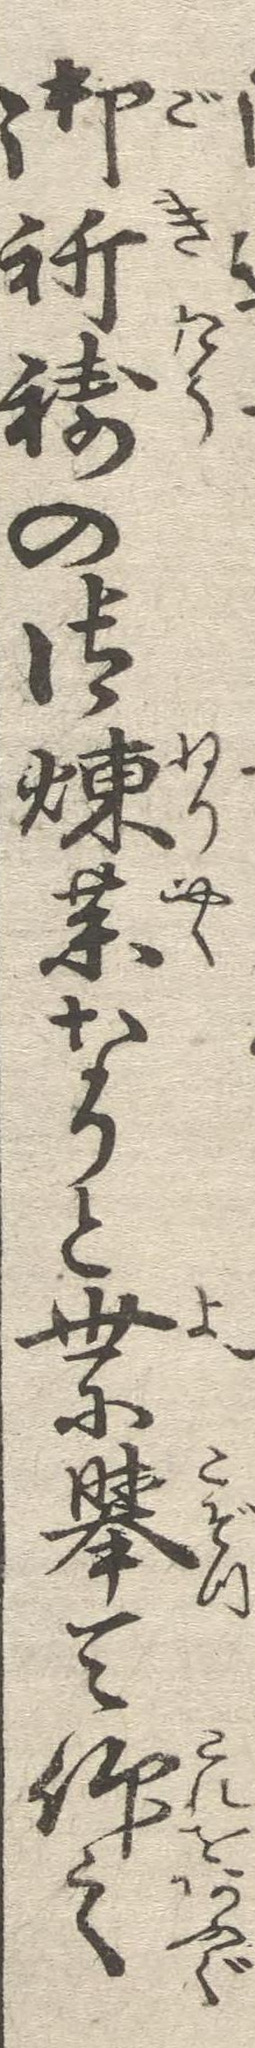御祈祷の御煉薬なりと世に挙て仰之
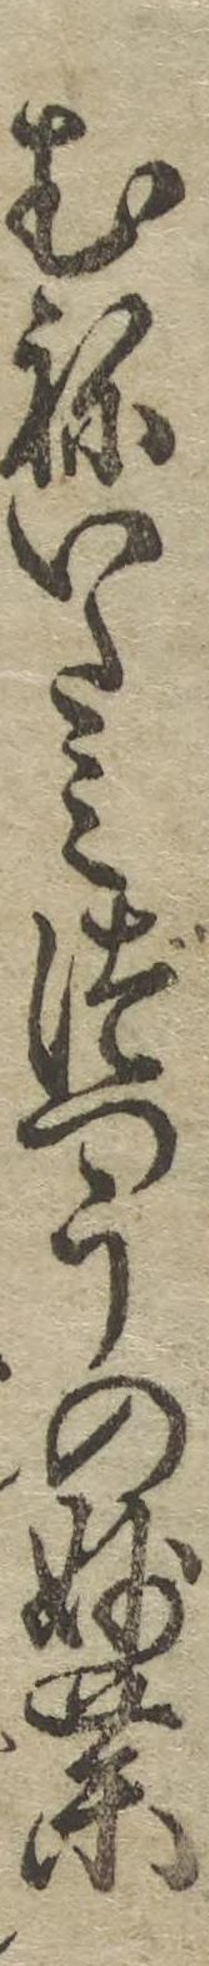むねいたみづつうの妙薬
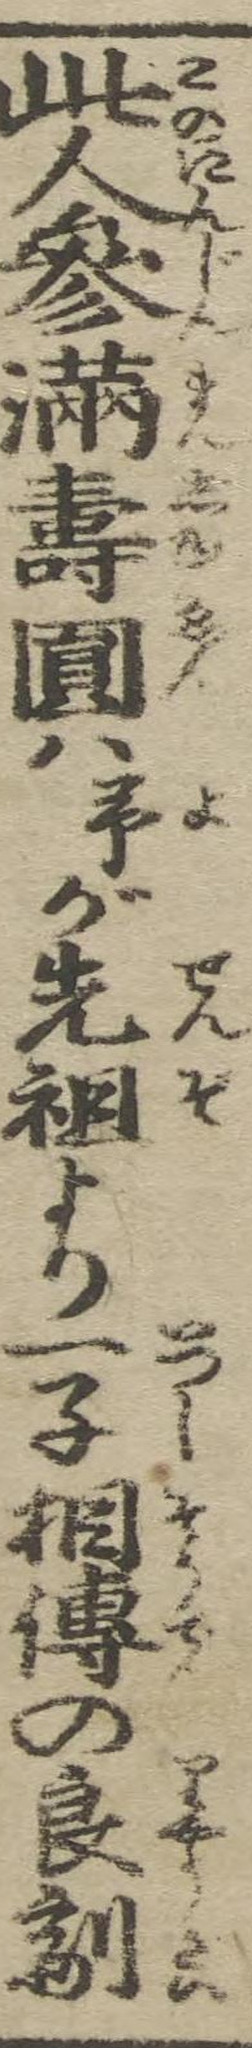此人参満寿円は予が先祖より一子相伝の良剤
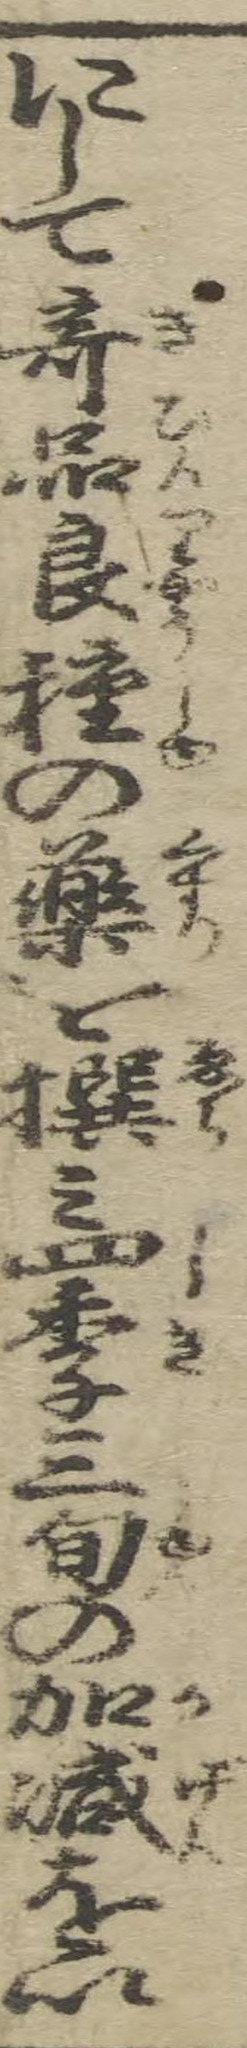にして奇品良種の薬を撰み四季三旬の加減を以
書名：浪華薬種問屋能書張交帖. 一
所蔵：国立国会図書館 National Diet Library, JAPAN
